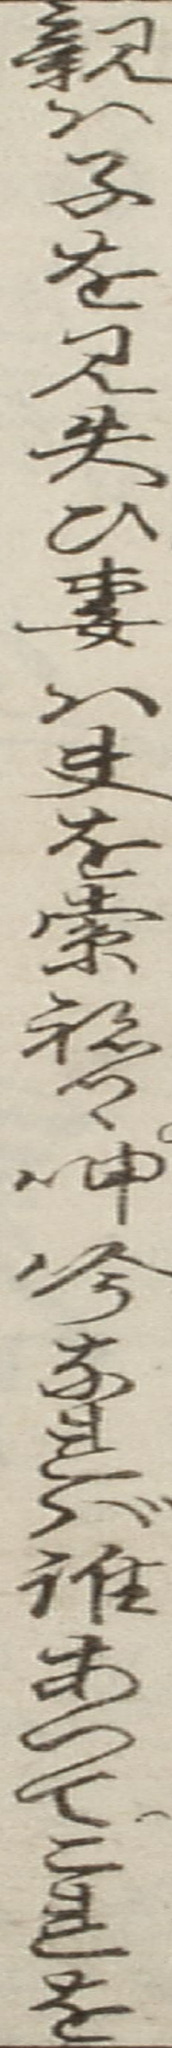親は子を見失ひ。妻は夫を索ねつゝ。呻吟なれば誰あつて。これを
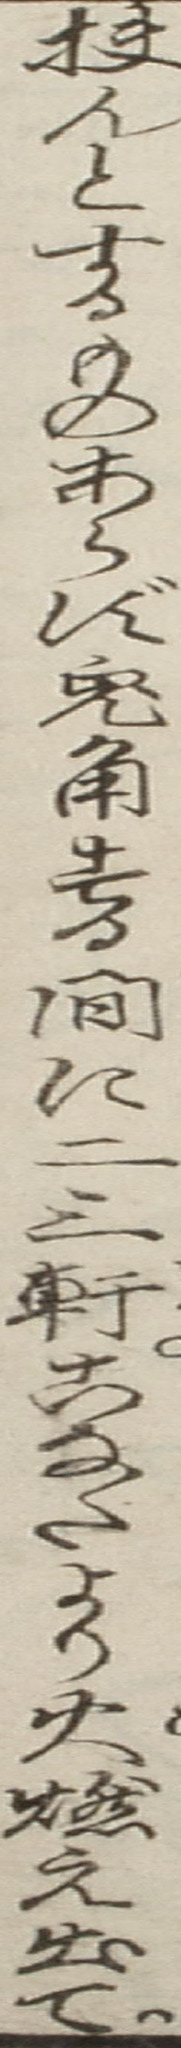扶んとするものあらず。兎角する間に二三軒。こなたより火燃え出て。
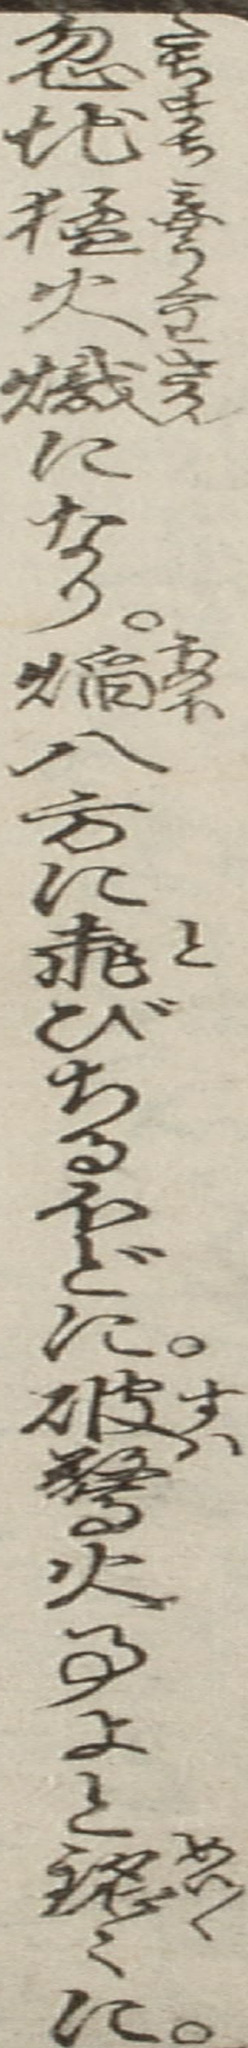忽地猛火熾になり。焔八方に飛びちるほどに。破驚火事よと銘〻に。
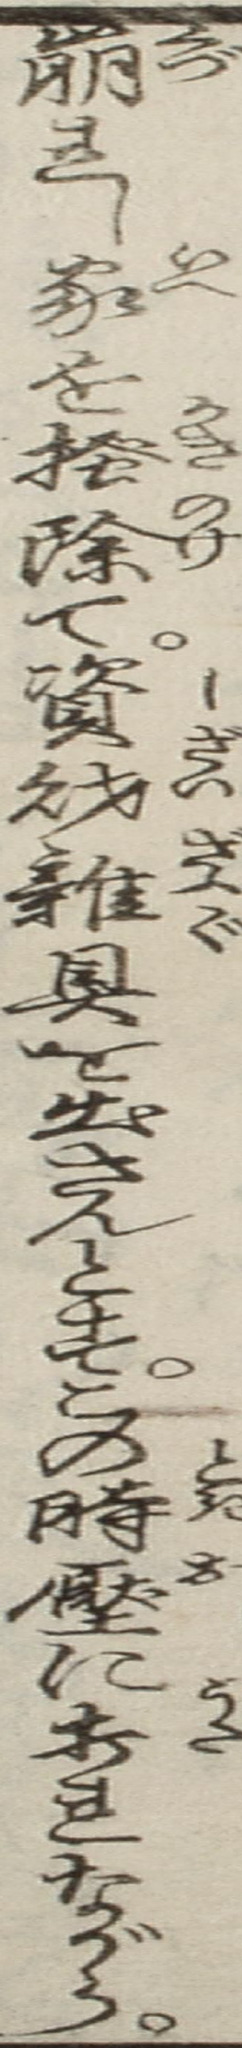崩れし家を掻除て。資財雑具を出さんとす。この時圧に打れながら。
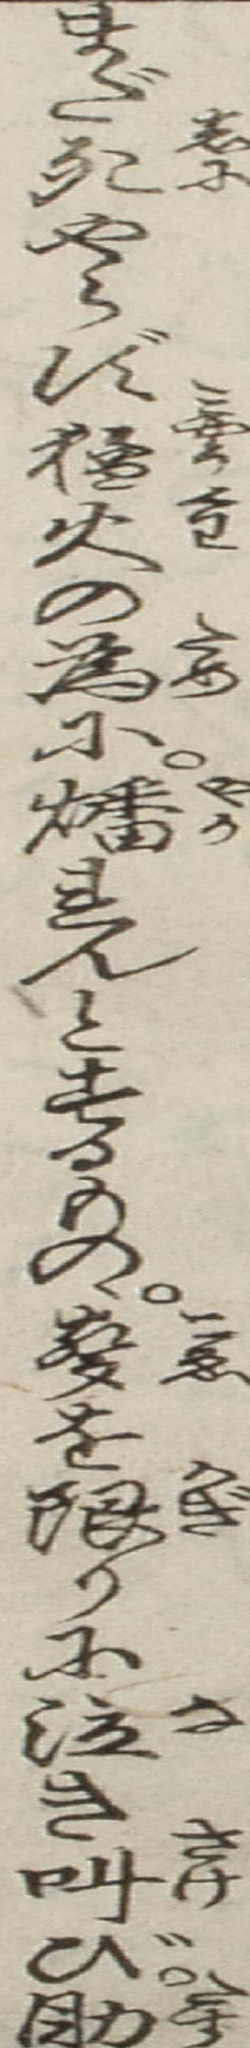まだ死やらず猛火の為に。燔れんとするものゝ。声を限りに泣き叫び。助
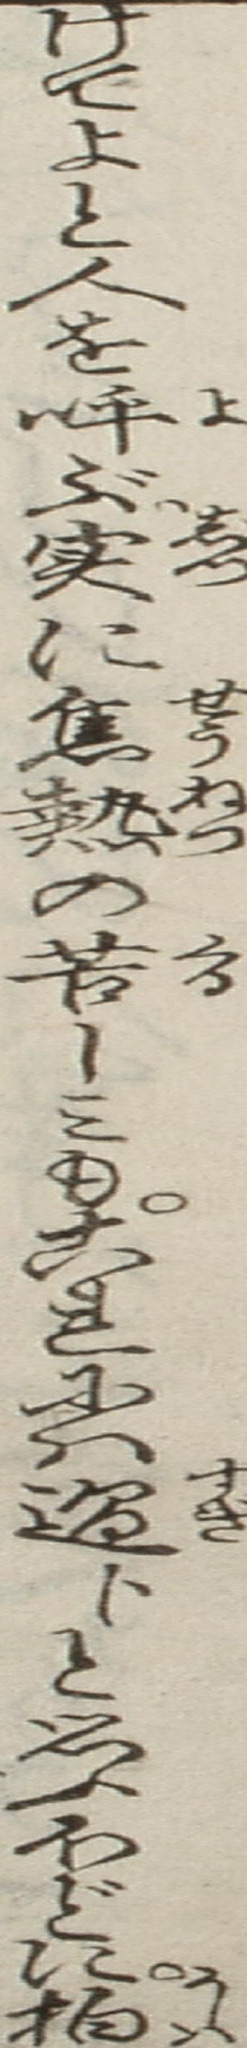けてよと人を呼ぶ。実に焦熱の苦しみも。これには過じと思ふほどに。柏
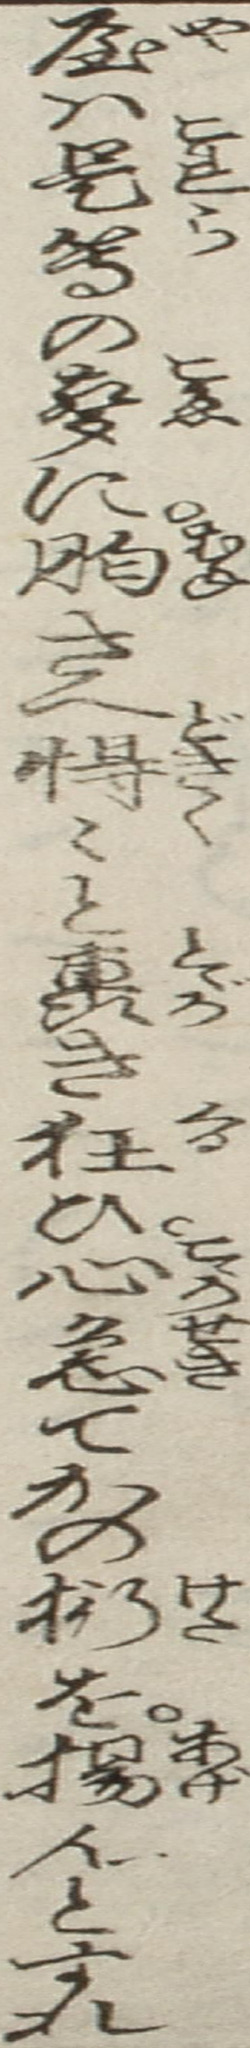屋は是等の声に。胸さへ得〻と轟き狂ひ。心急てかの桁を。揚んとすれ
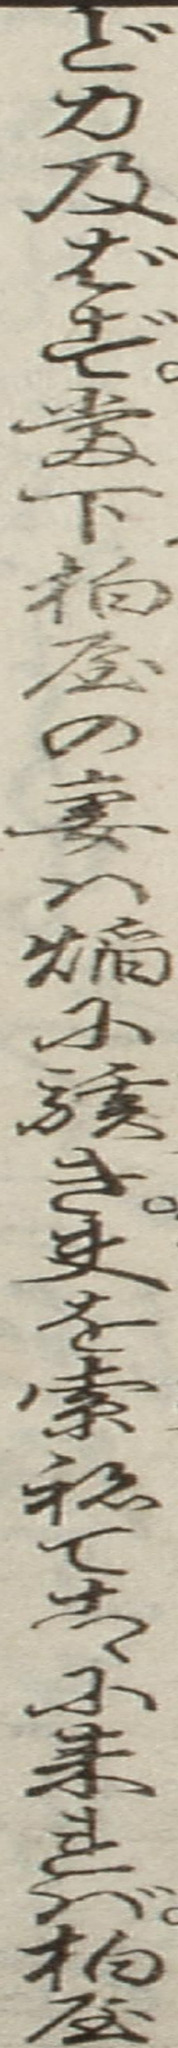ど力及ばず。當下柏屋の妻は焔に駭き。夫を索ねてこゝに来れば。柏屋
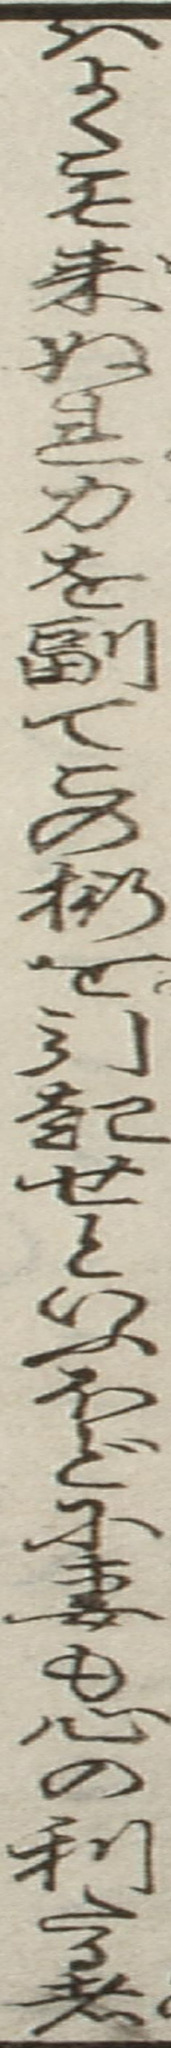はよくこそ来ぬれ。力を副てこの桁を。引起せといふほどに。妻も心の利たる者
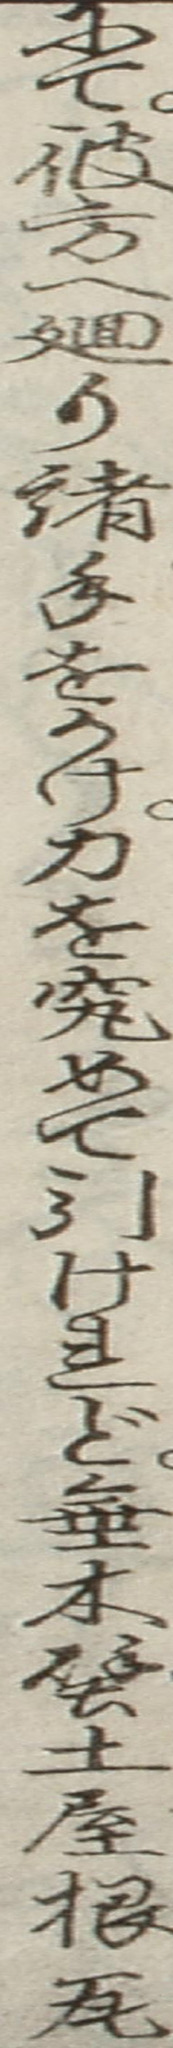にて。彼方へ廻り諸手をかけ。力を究めて引けれど。垂木壁土屋根瓦。
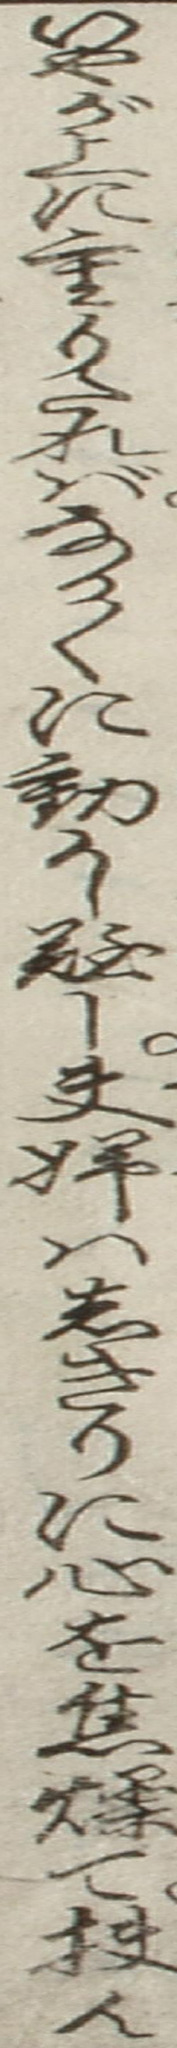いやが上に重りたれば。なか〳〵に動かし難し。夫婦はしきりに心を焦燥て。扶ん
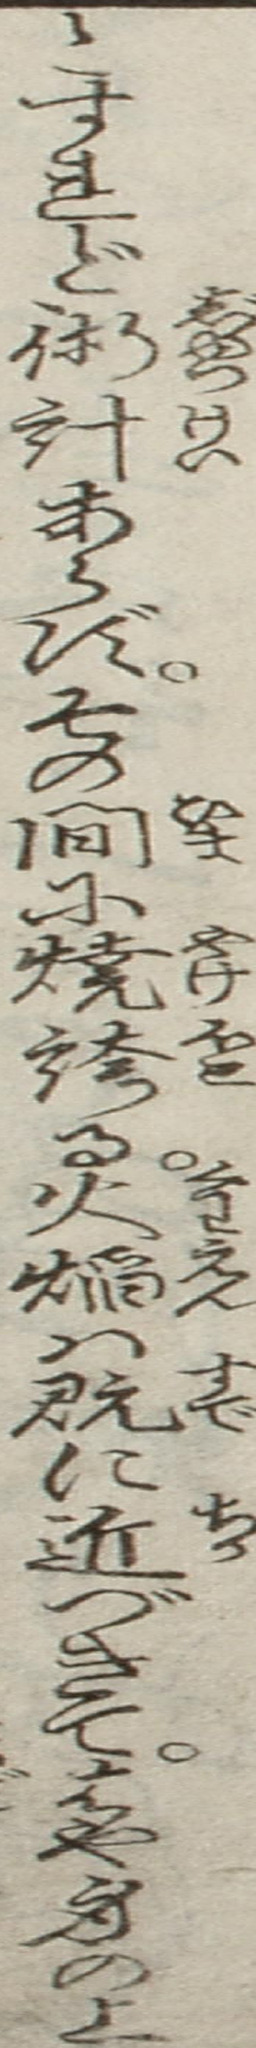とすれど術計あらず。その間に焼誇る。火焔は既に近づきて。はや身の上
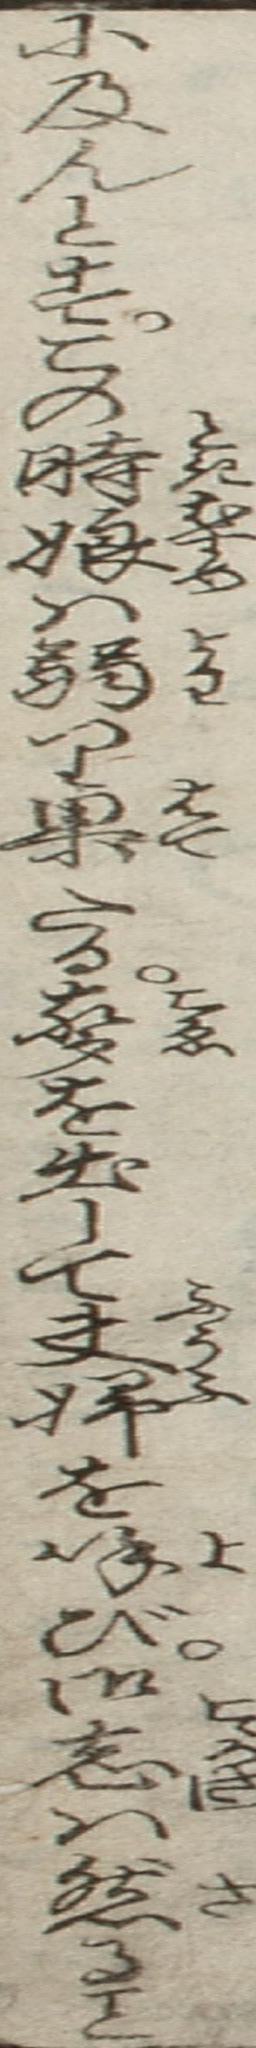に及んとす。この時娘は弱り果たる。声を出して夫婦を呼び。御志は然ること

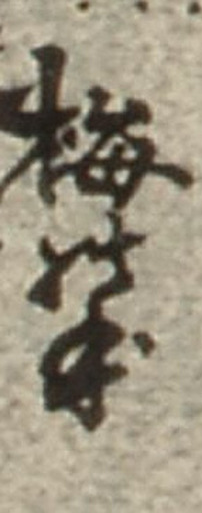梅の本
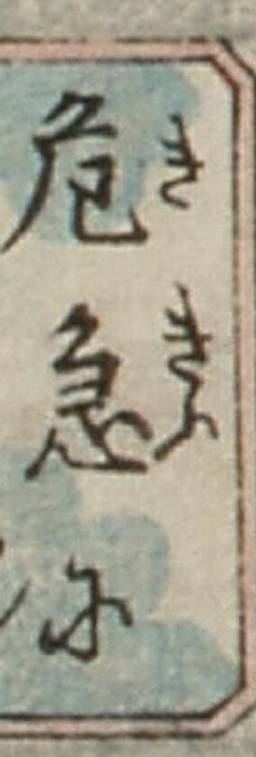危急に
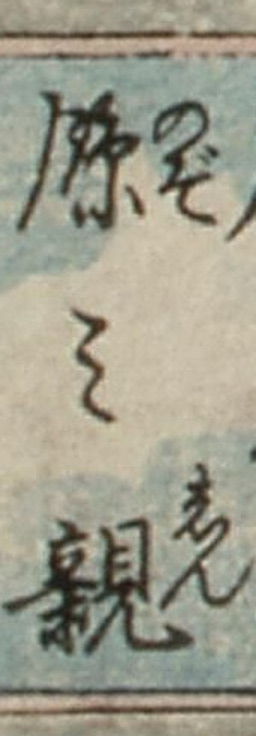臨み親
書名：安政見聞録　上
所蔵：東京大学地震研究所図書室 Earthquake Research Institute Library, The University of Tokyo, JAPAN
